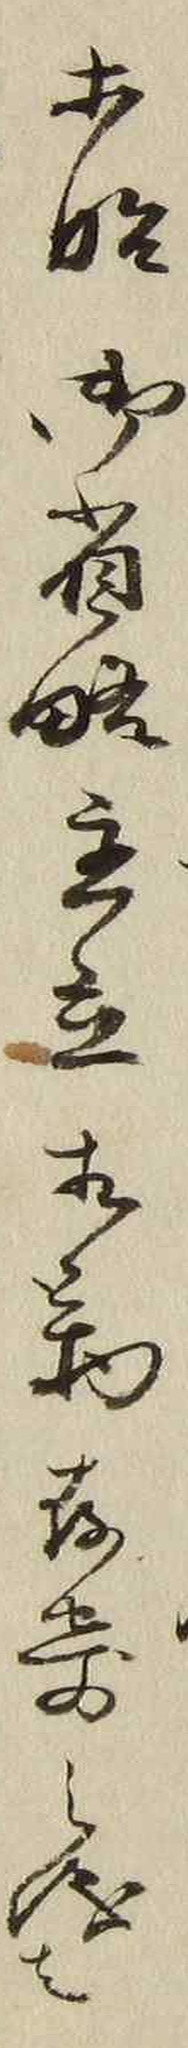等始御省略主立相勤存寄之儀は
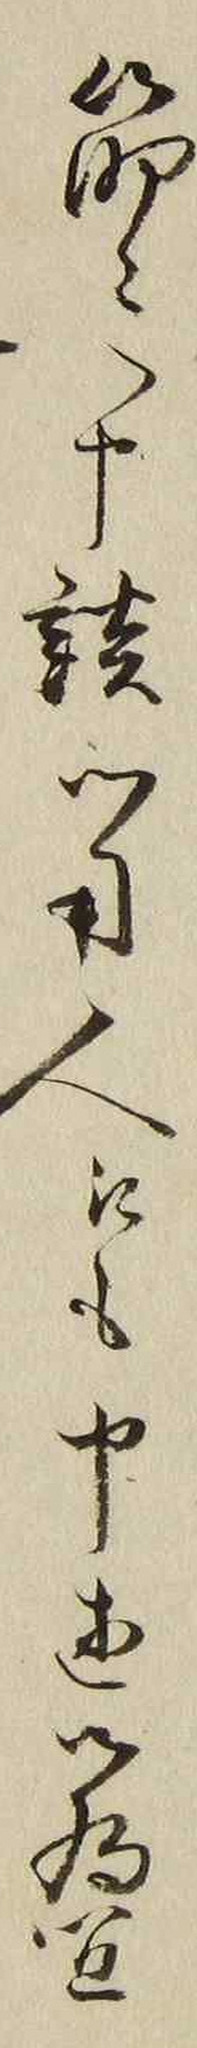筋々へ申談御用人江も申述御為宜
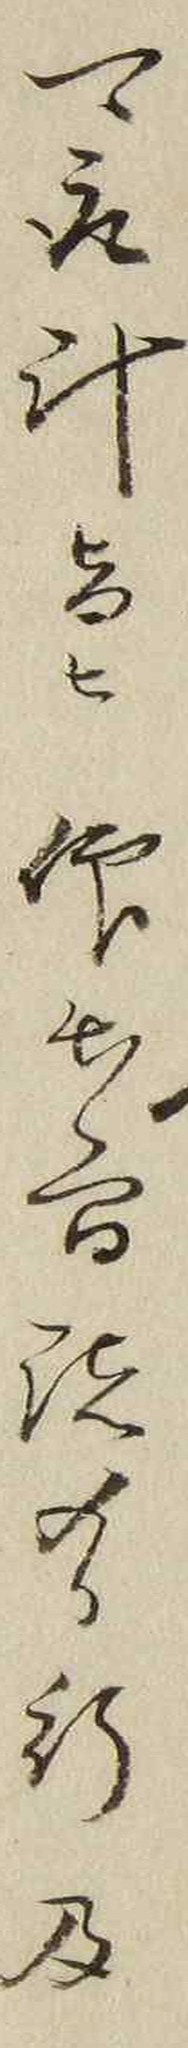可取計旨被仰出候間諸〆り行及
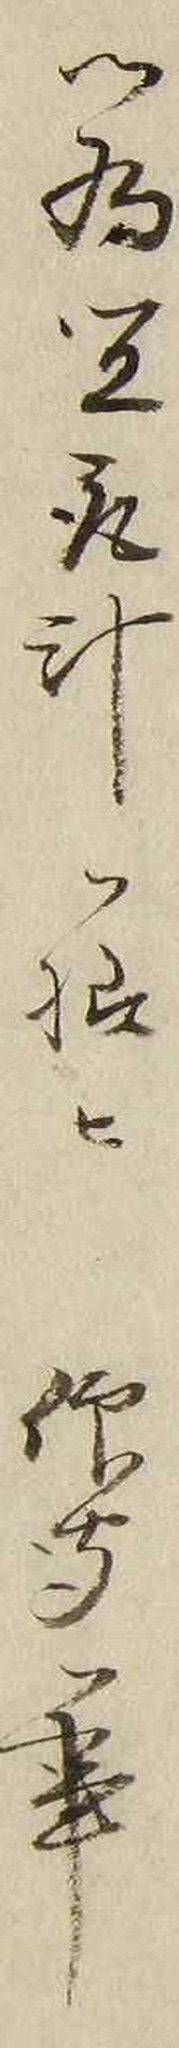御為宜取計候様被仰聞候事

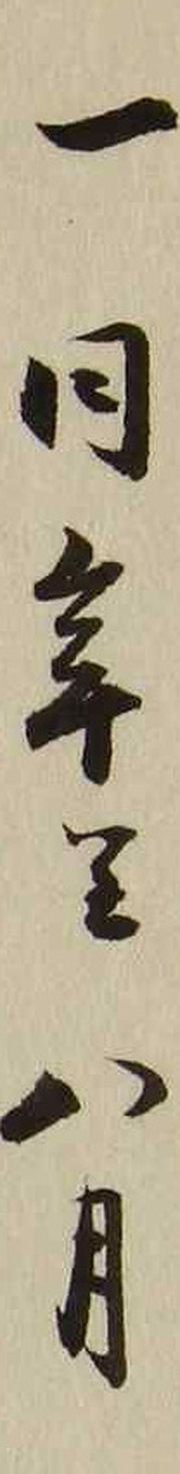一同年閏八月
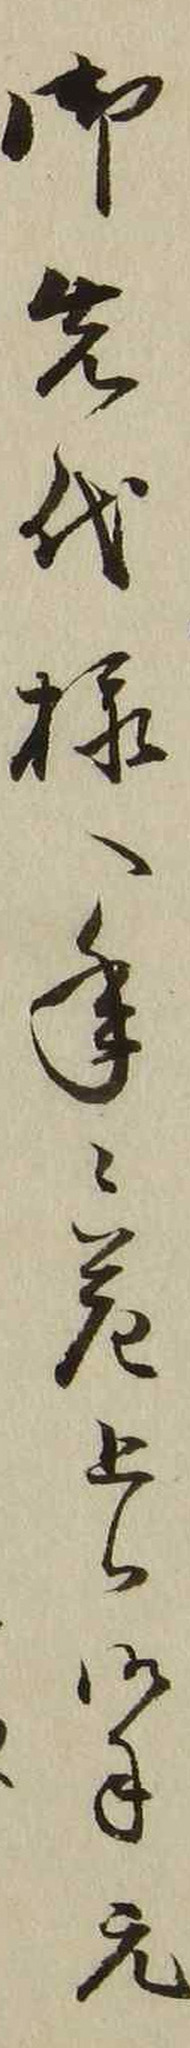御先代様へ年々差上候御手元
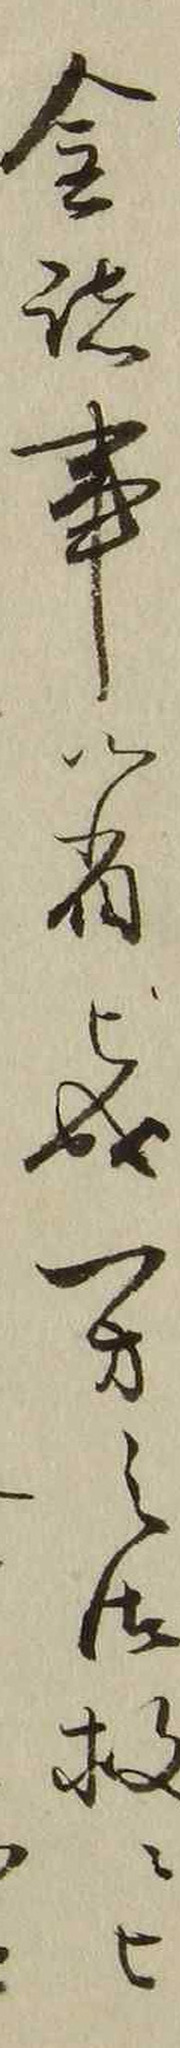金諸事御省被成一方之御救に被
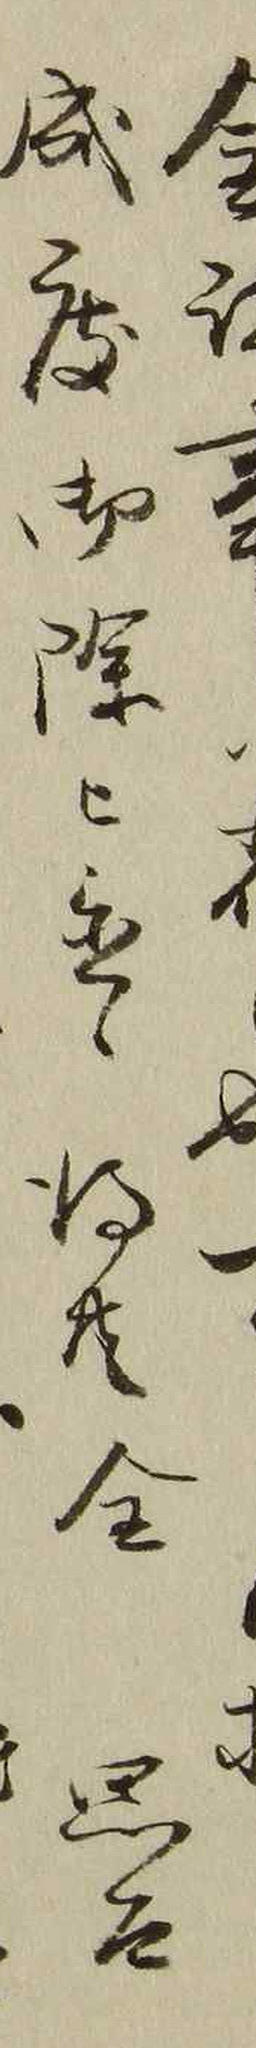成度御除被置候得共全思召
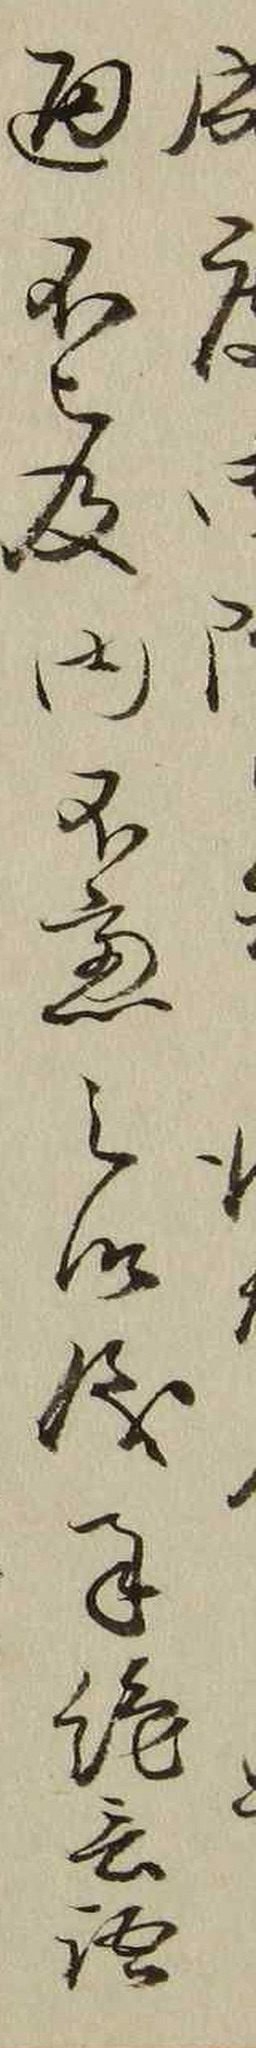通不被及内不慮之御儀奉絶言語
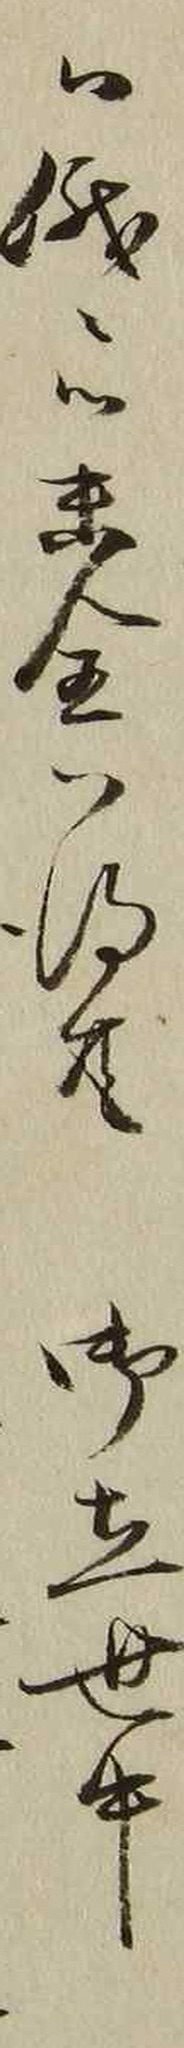候儀には未全候得共御在世中
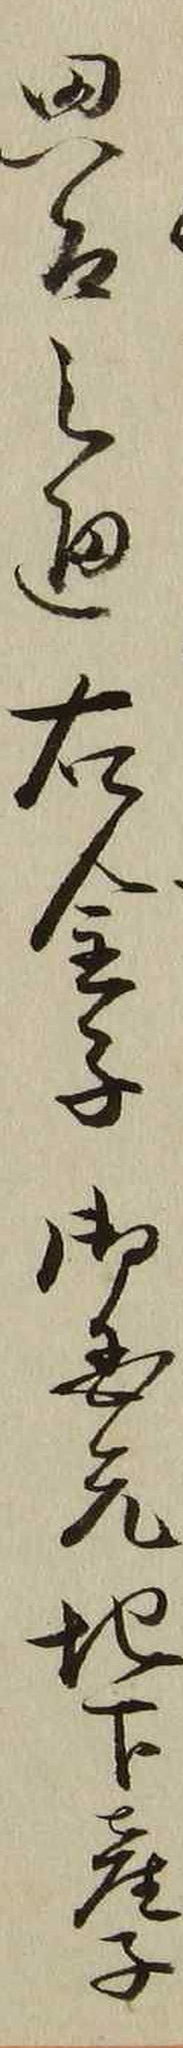思召之通右金子御国元地下産子
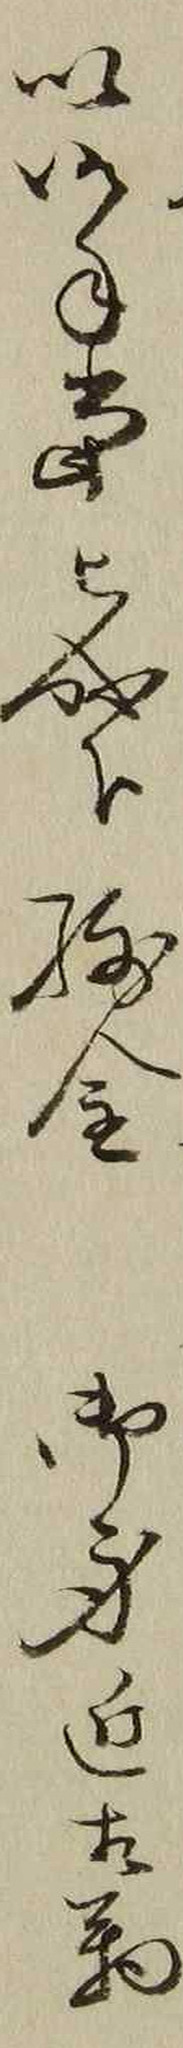以御手当被成下残金御身近相勤
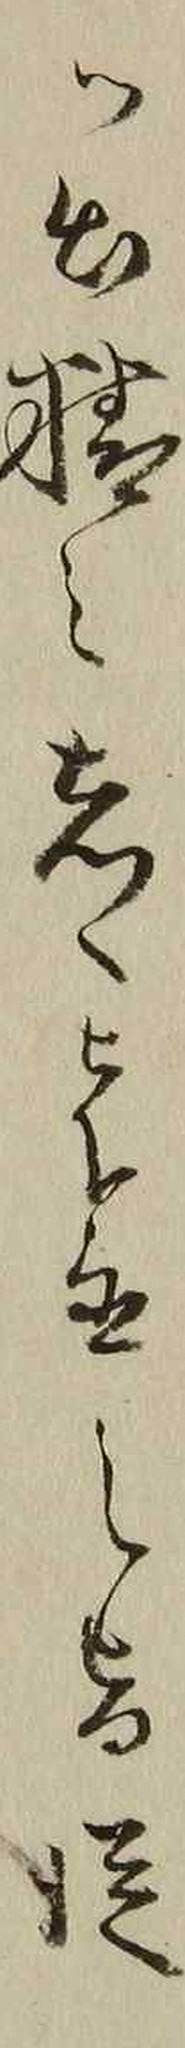候出精之者へ被下置之旨従
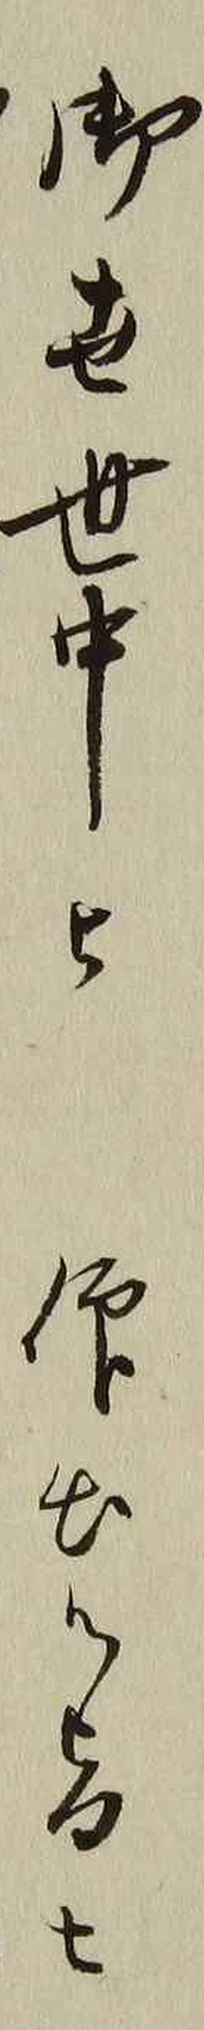御世世中被仰出候旨被
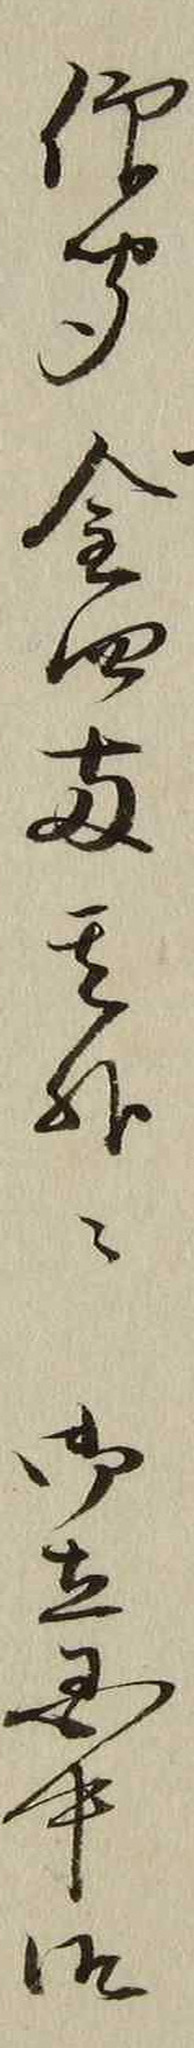仰聞金四両其外に御在国中御
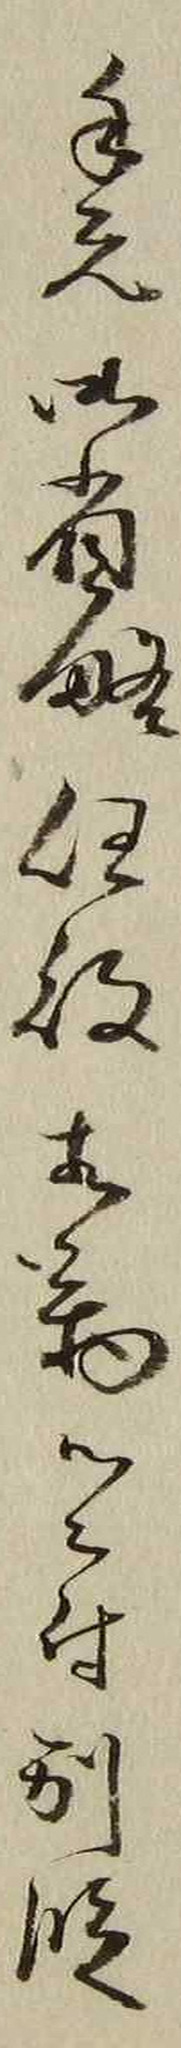手元御省略任役相勤候に付別段
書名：諸士系譜　巻之292　き之部1
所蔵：会津若松市立会津図書館
